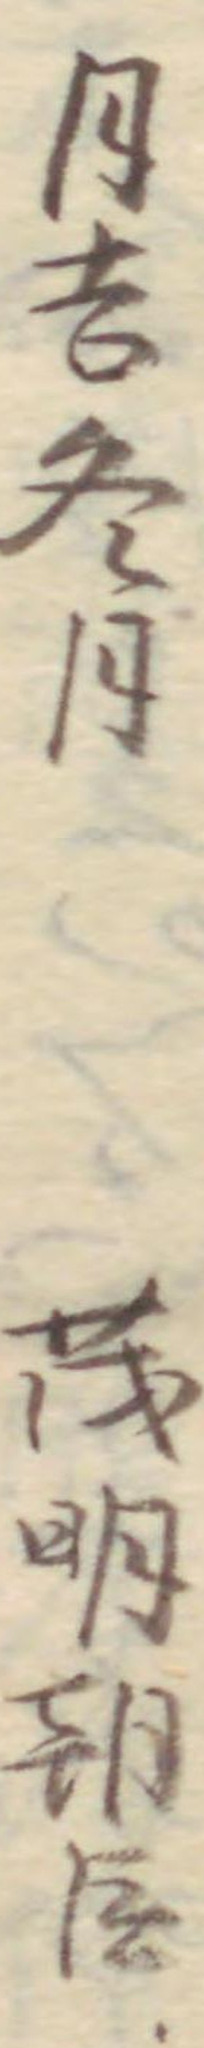月吉冬月茂明朝臣
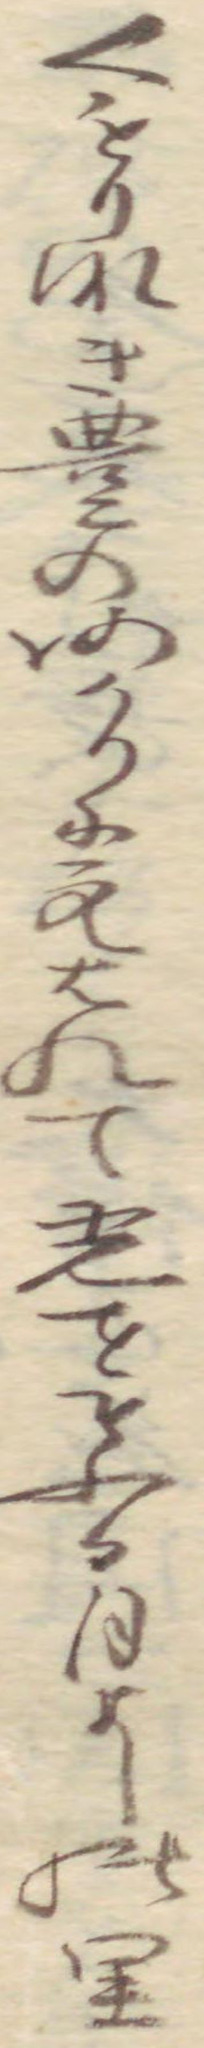くもりなき豊のあかりに空はれて光をそふる月よしの里
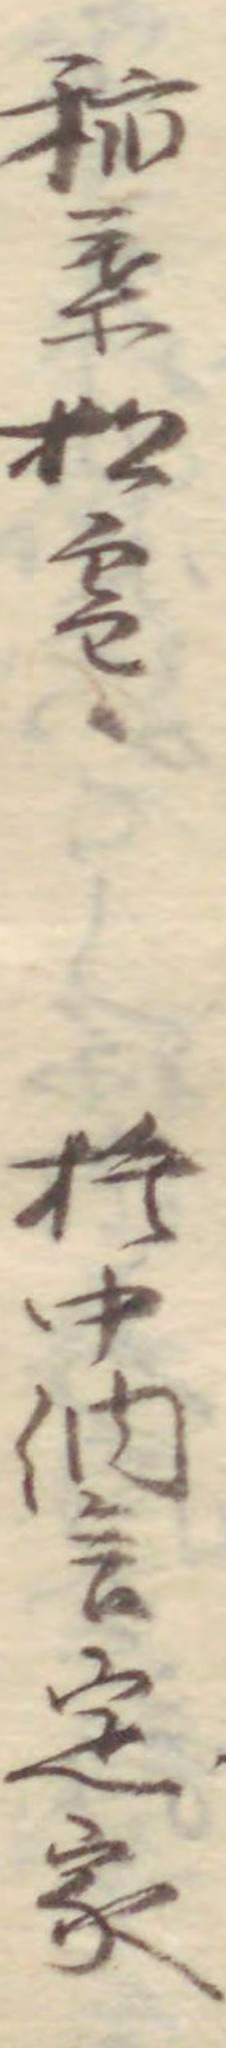稲葉松雪権中納言定家
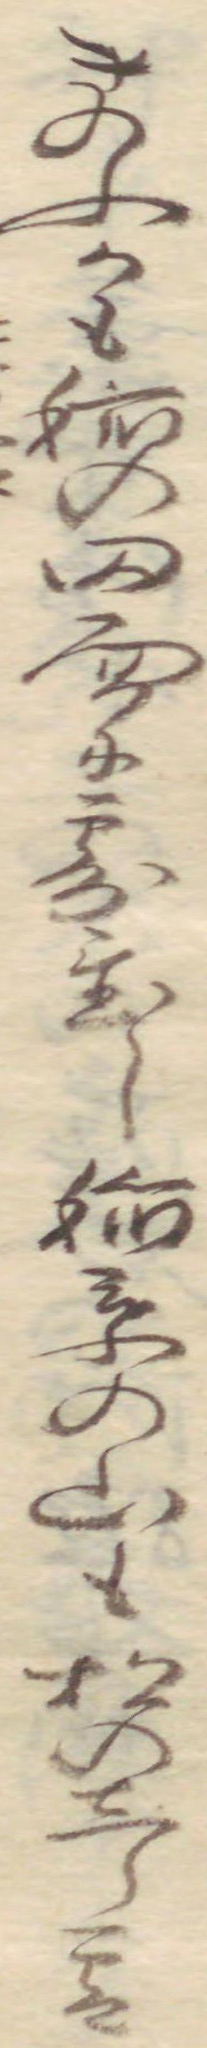きのふかも稲の田面に露置し稲葉の山も松のしら雪
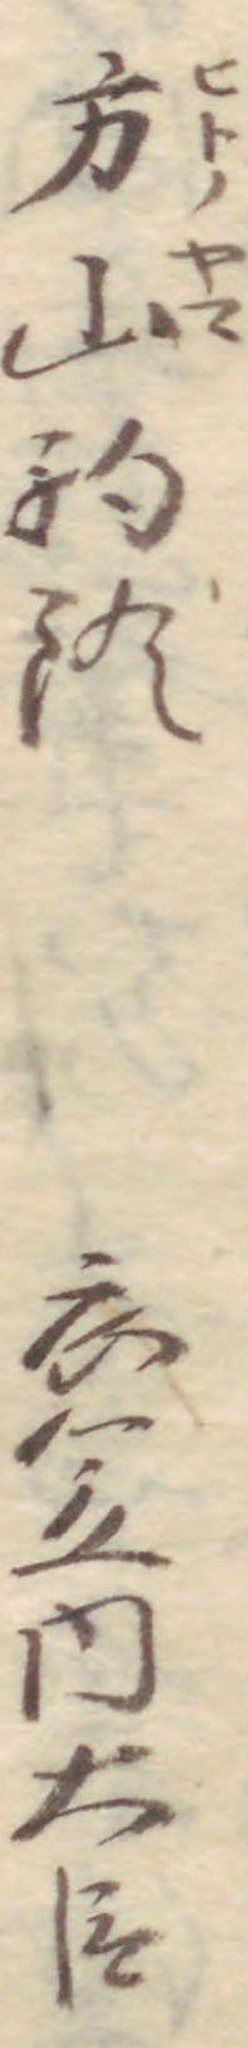方山駒鈴衣笠内大臣
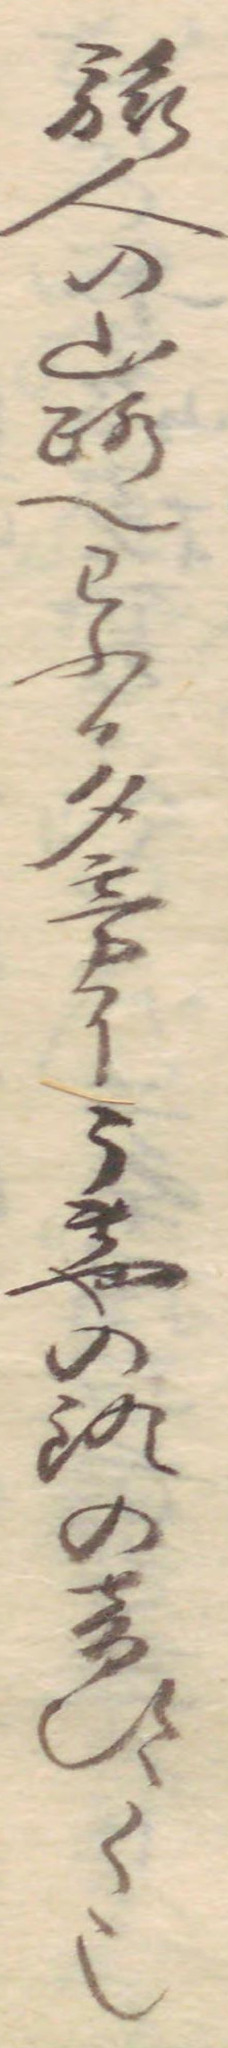旅人の山路へわふる夕旁？にうまやの鈴の音ひゝく也
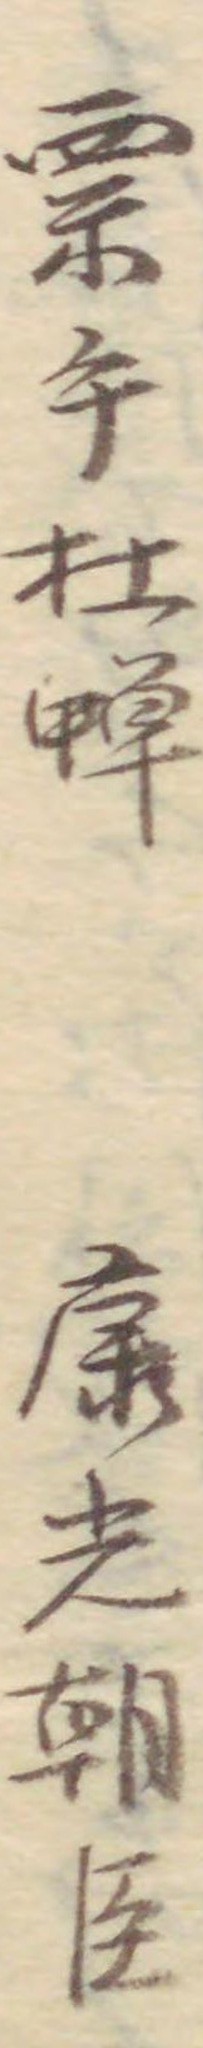粟手杜蝉康光朝臣
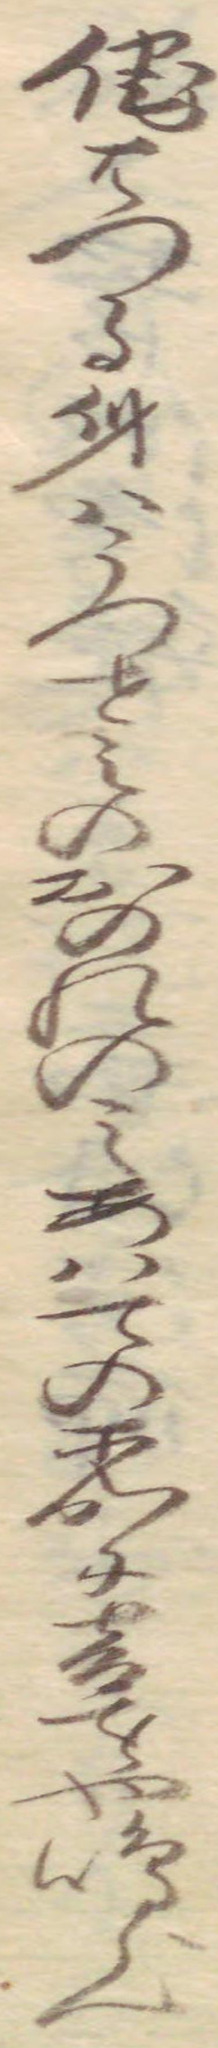侘はつる身はうつせみのおのれのみあはての森に音をや鳴らん

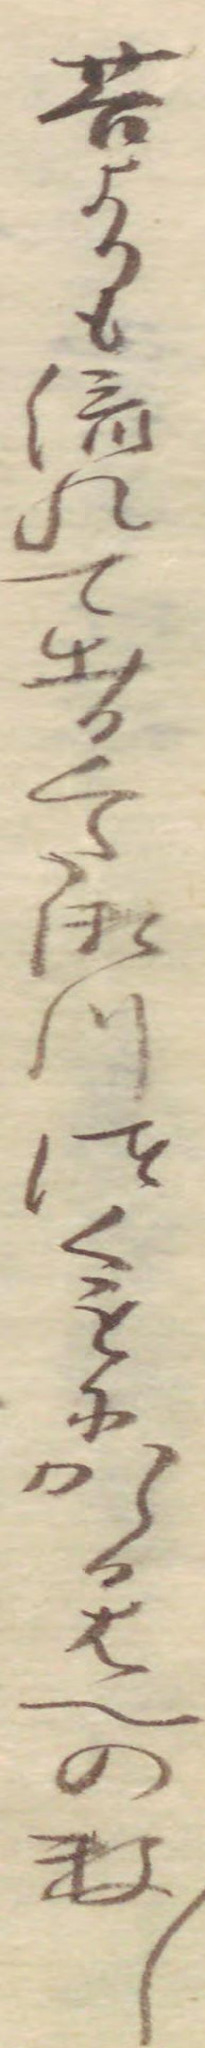苔よりも流れて出るくた瀬川つくもにかゝるはへの数〳〵
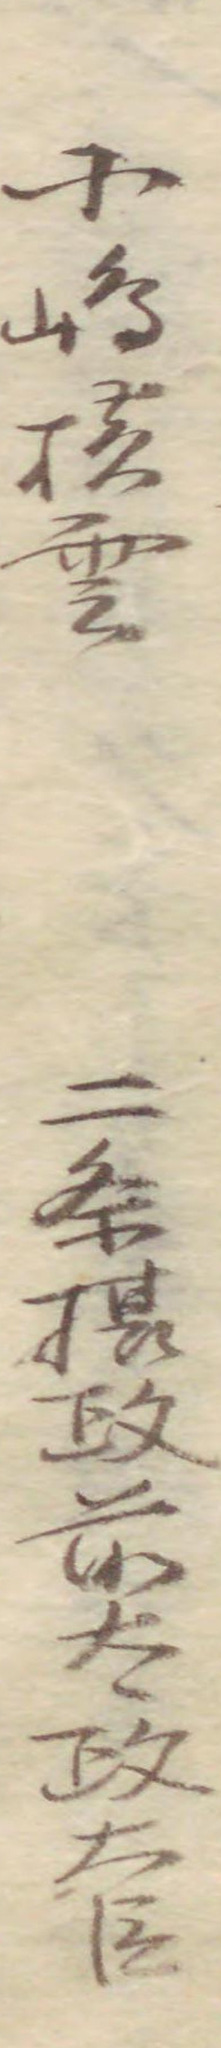小嶋横雲二条摂政前太政大臣
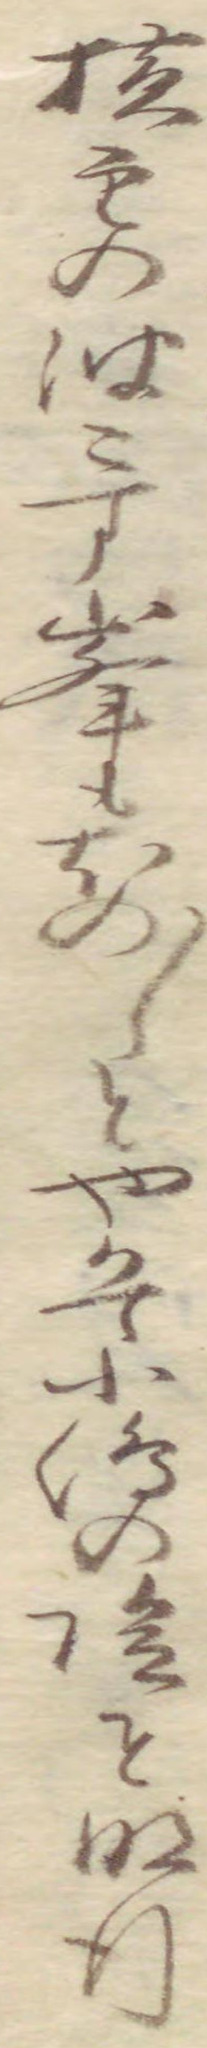横雲の波こす峰もほの〳〵とやかて小嶋の陰そ明行
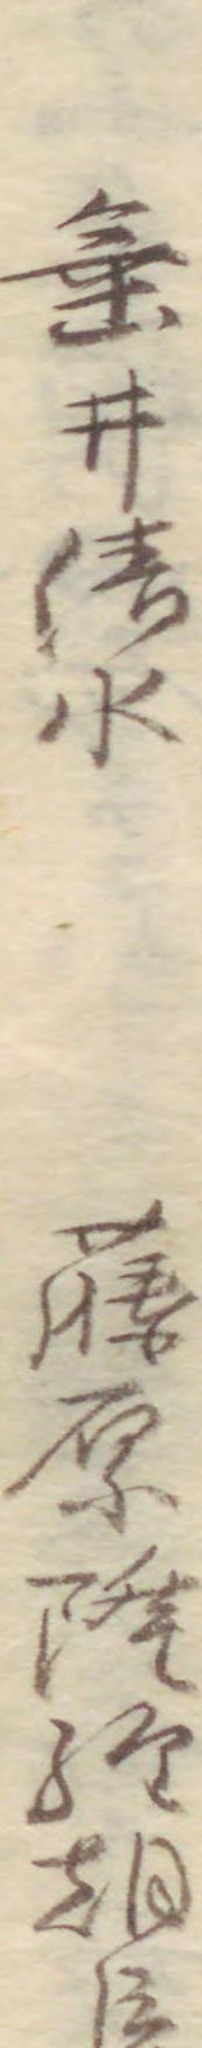垂井清水藤原隆経朝臣
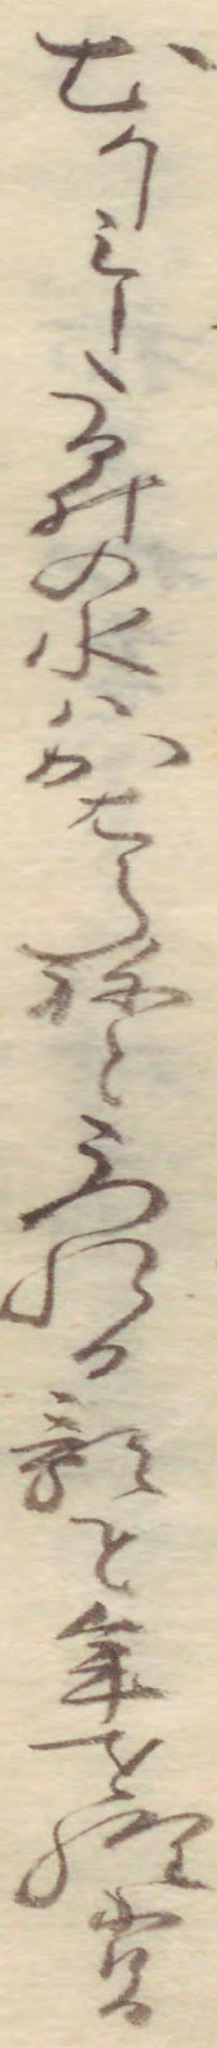むかしみしたる井の水はかはらねとうつれる影そ年を経にける
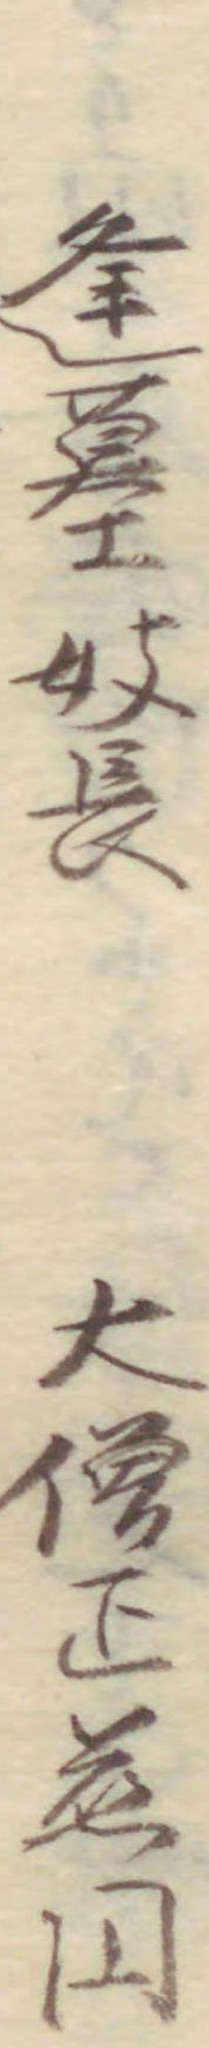逢墓妓長大僧正慈円
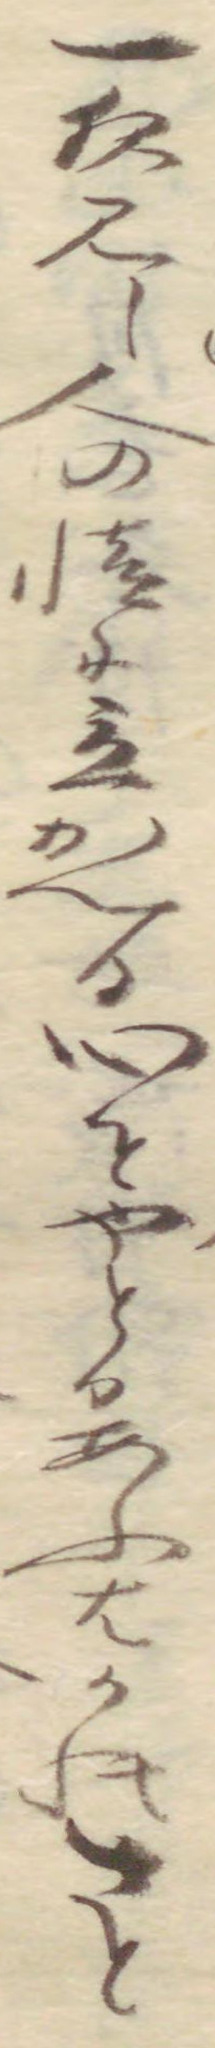一夜見し人の情に立かへる心そやとるあふはかのさと
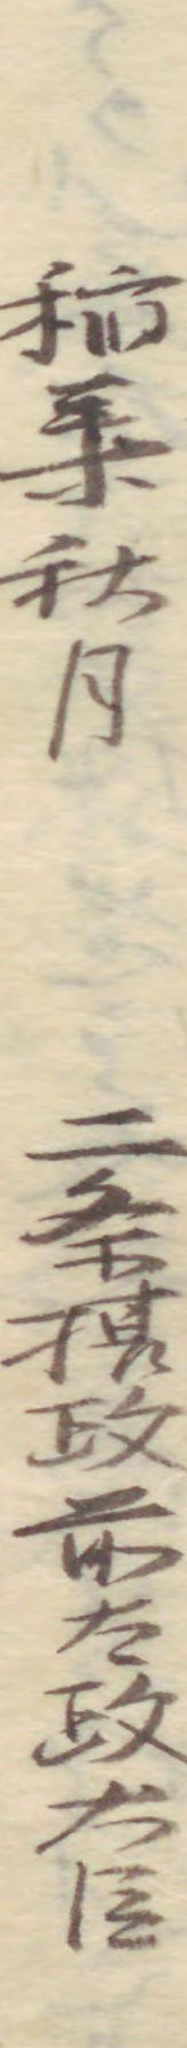又稲葉秋月二条摂政前太政大臣
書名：鶯宿雑記. 巻263-264
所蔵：国立国会図書館 National Diet Library, JAPAN
